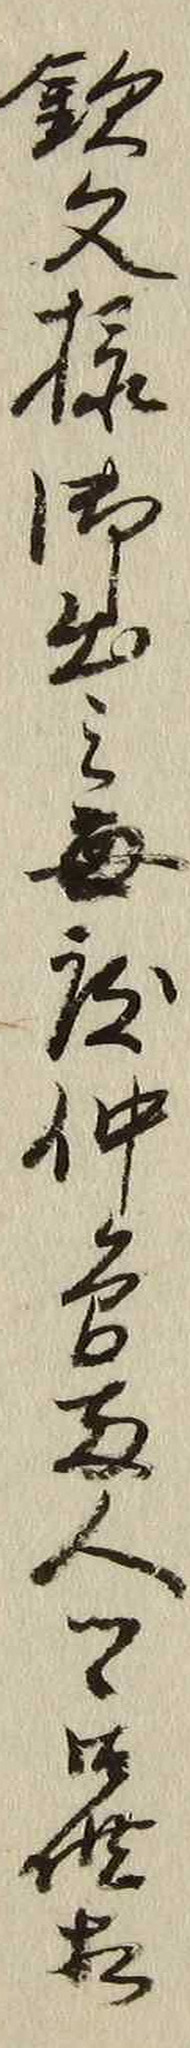欽文様御出之毎度仲ケ間両人ツヽ御供相
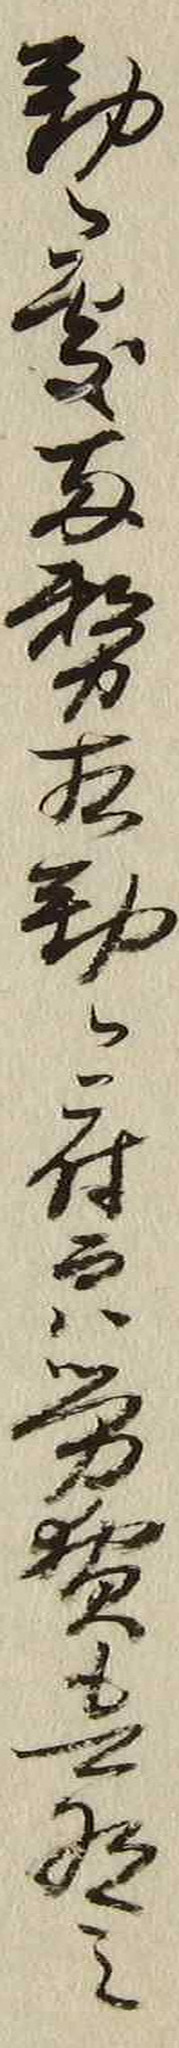勤候処両務相勤候ニ付而ハ労費も可有之
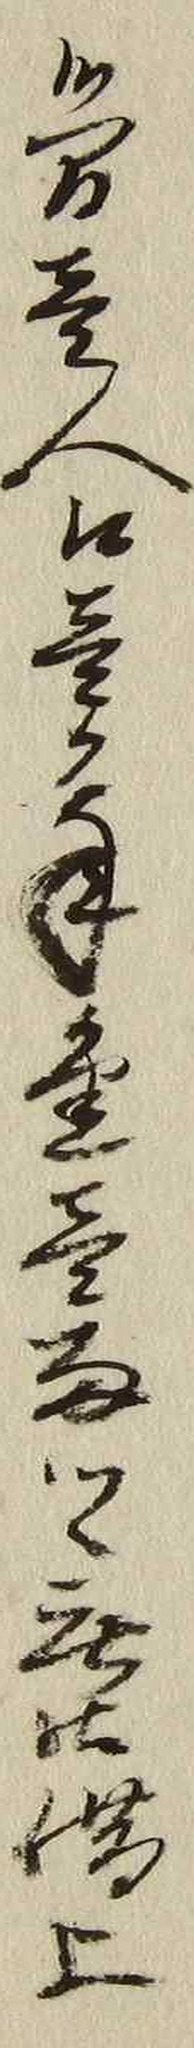候間壱人江壱ケ年金壱両ツヽ無御借上
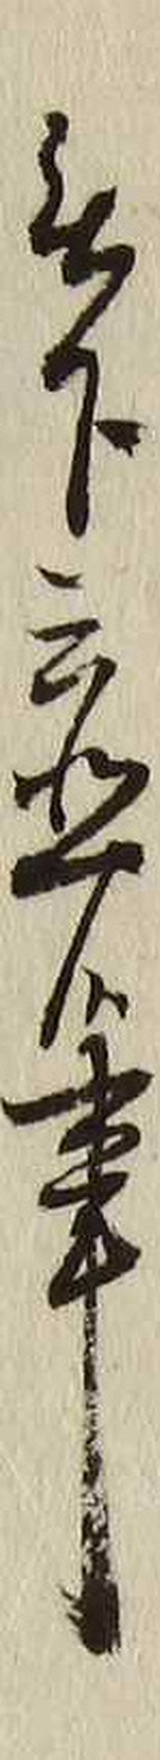被下置候事
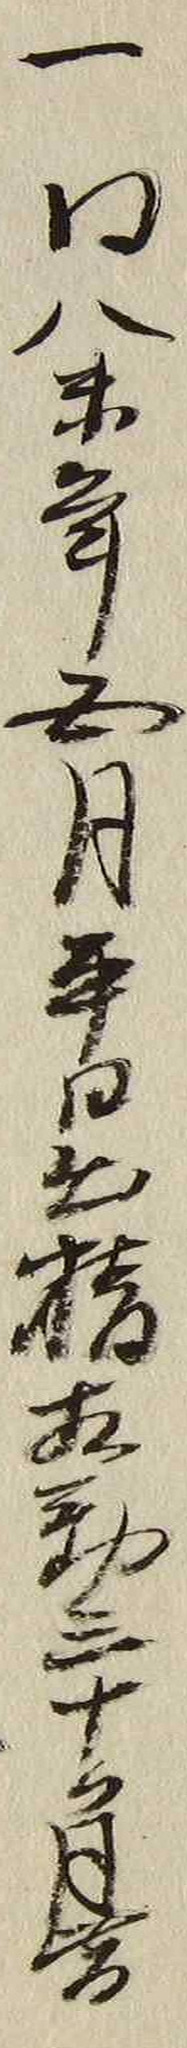一同八未年五月平日出精相勤三十ケ月皆
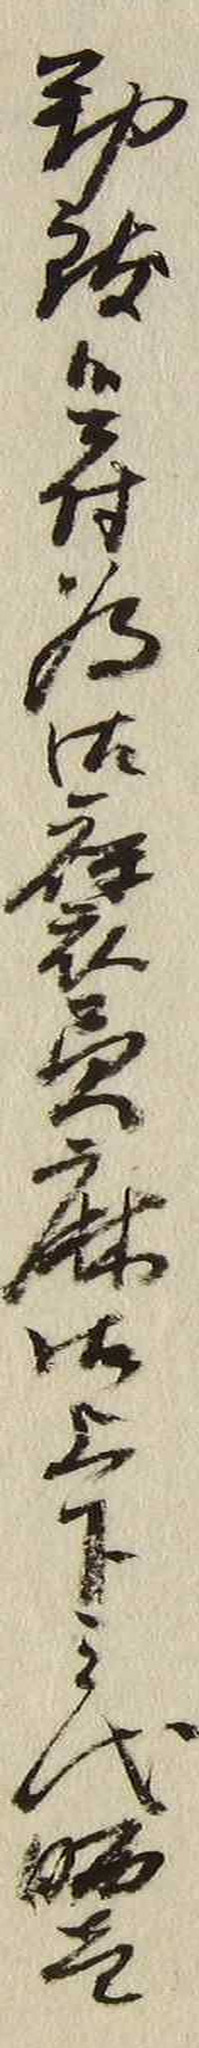勤致候ニ付為御褒美麻御上下之代晒壱
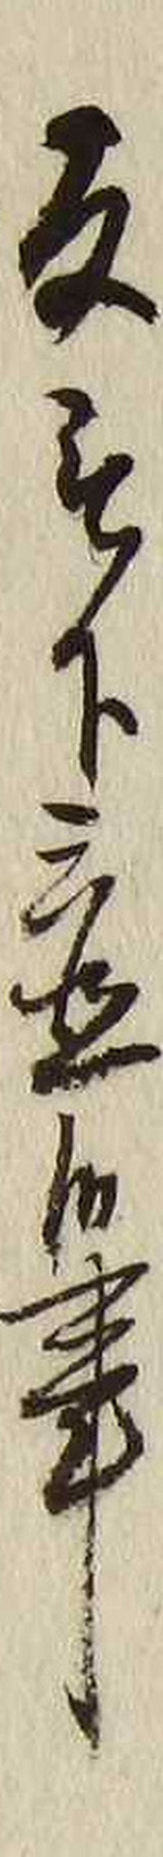反被下置候事
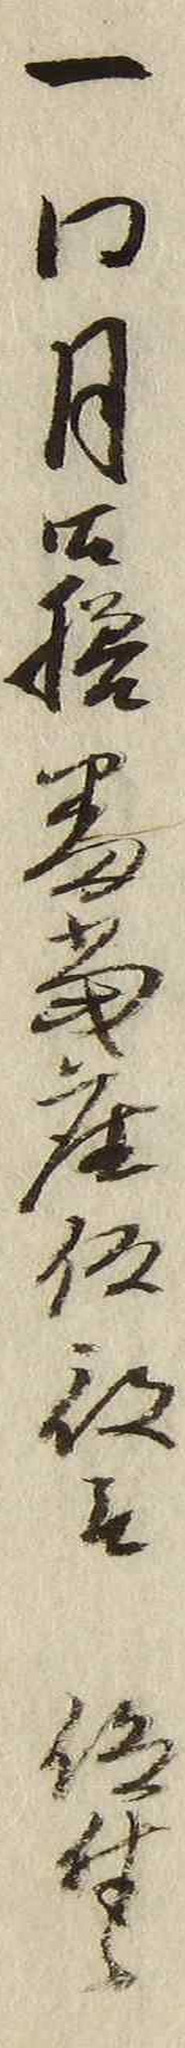一同月御膳番当座仮役被仰付候

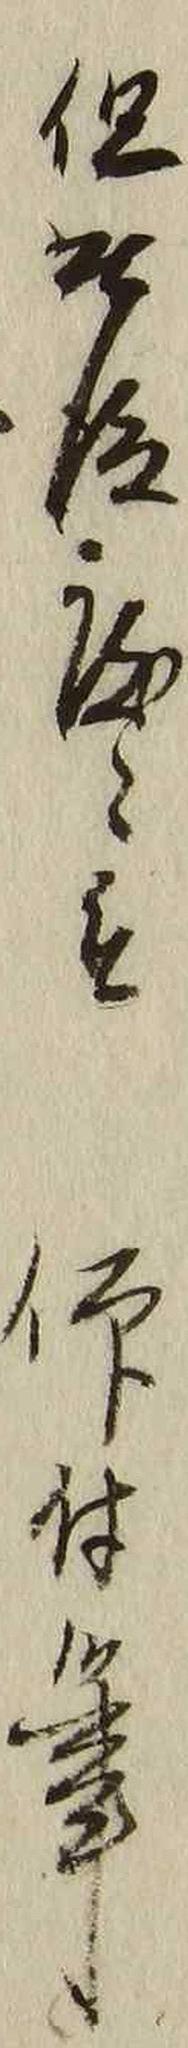但此後度々被仰付候事
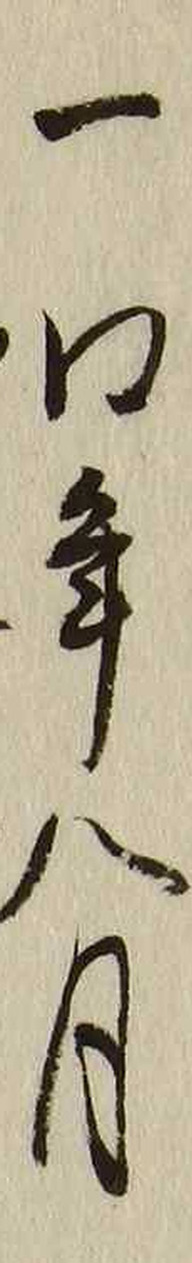一同年八月
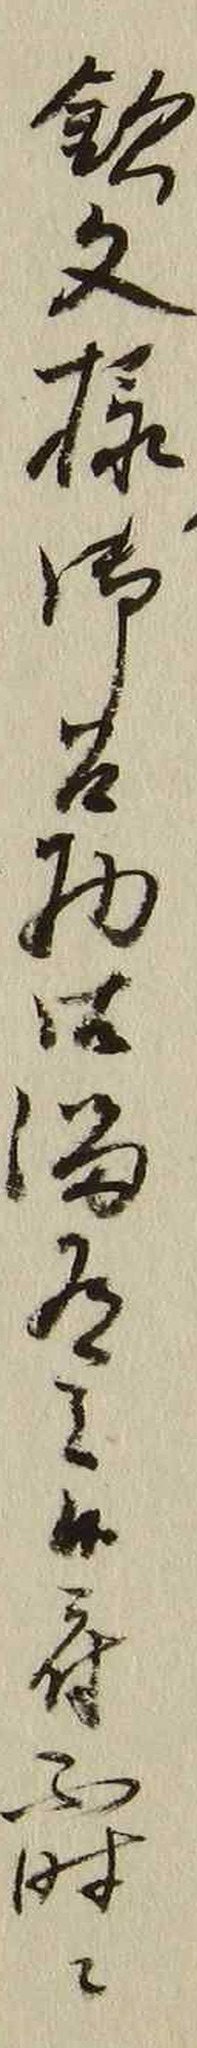欽文様御召物御溜有之候ニ付不時ニ
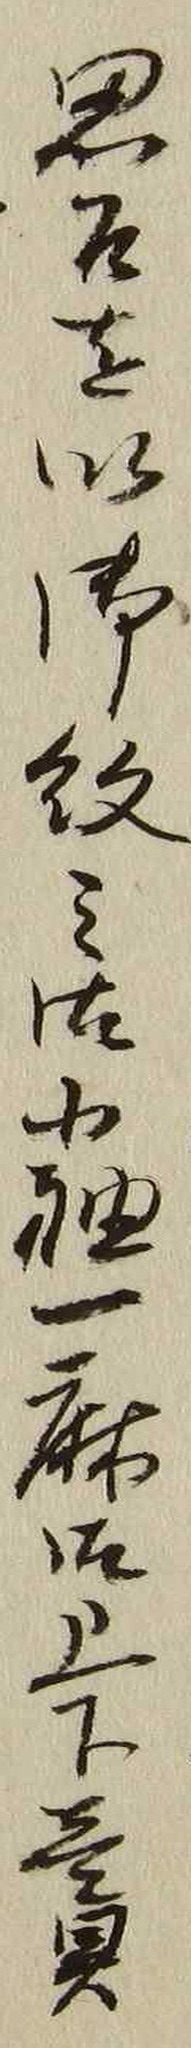思召を以御紋之御小袖一麻御上下壱具
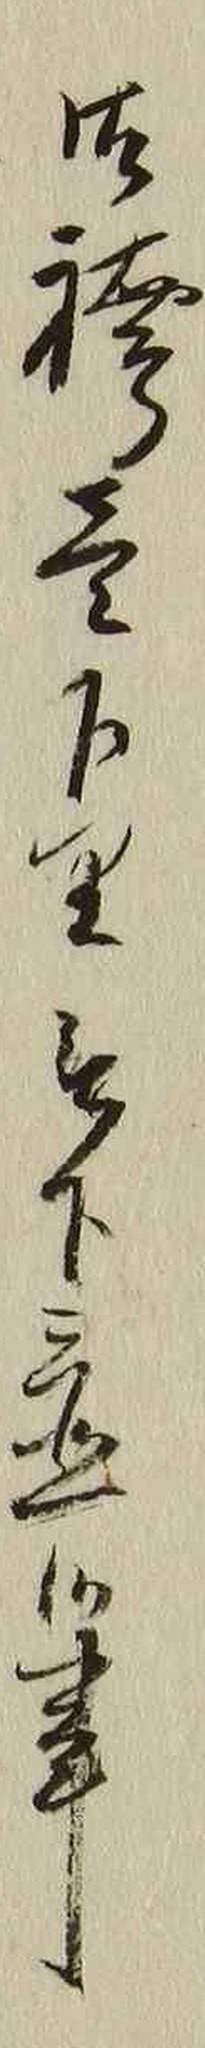御袴壱下り被下置候事
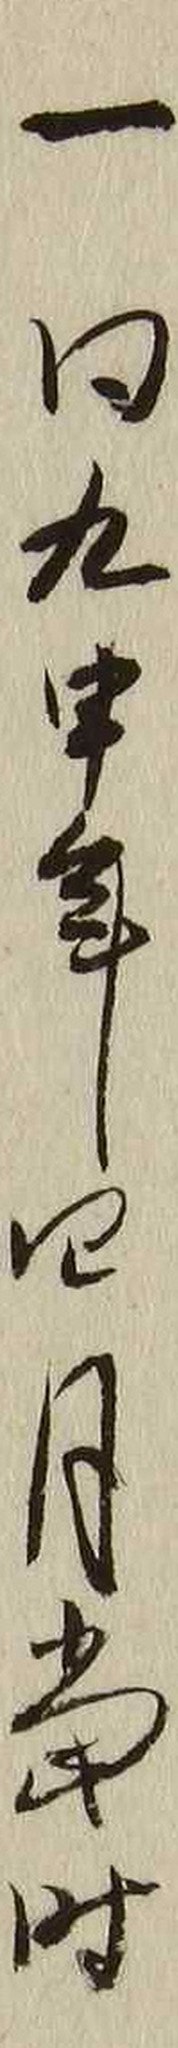一同九申年四月当時
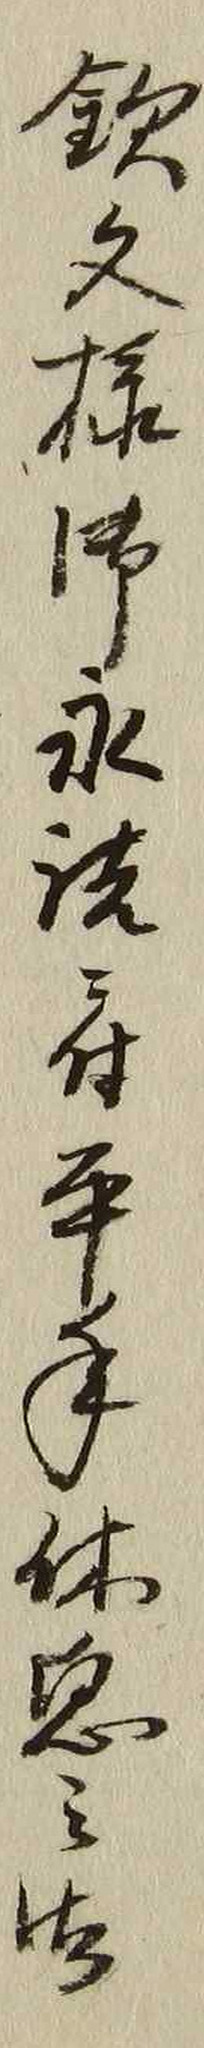欽文様御永詰ニ付平年休息之御
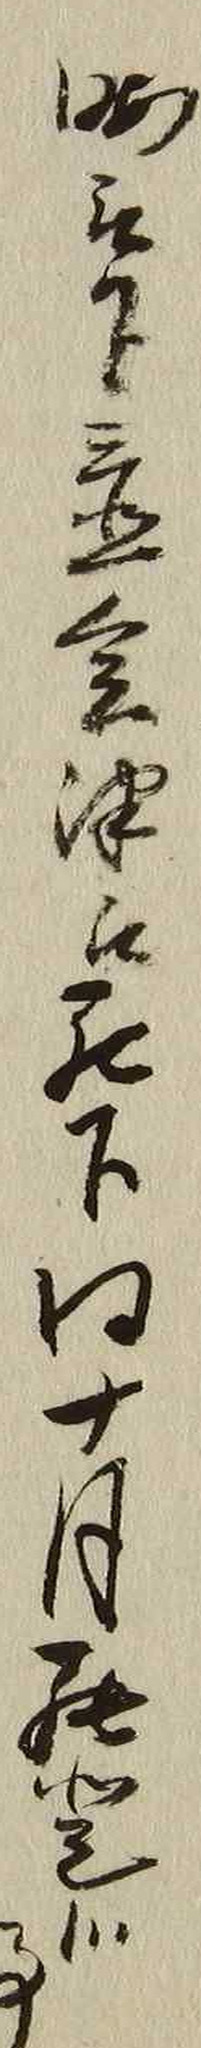暇被下置会津江罷下同十月罷登候事
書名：諸士系譜　巻之345　も之部1
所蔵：会津若松市立会津図書館
